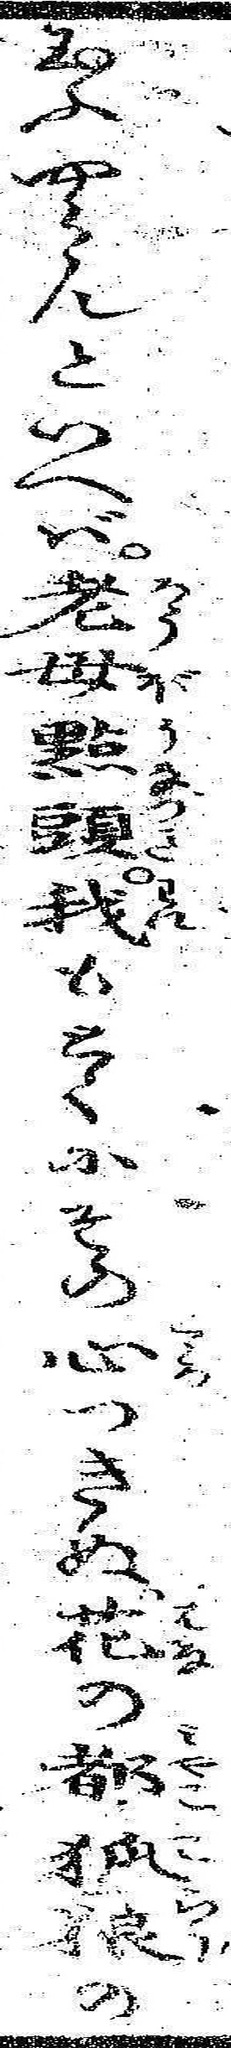玉ふやらんといへば。老母点頭。我もとくにその心つきぬ。花の都狐狼の
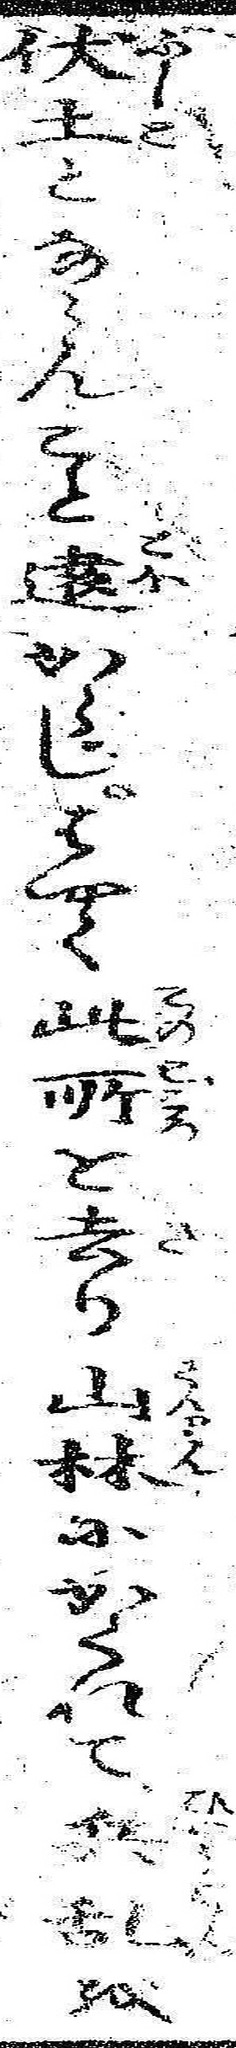伏土とならんこと遠からじ。はやく此所を去り山林にかくれて兵乱を
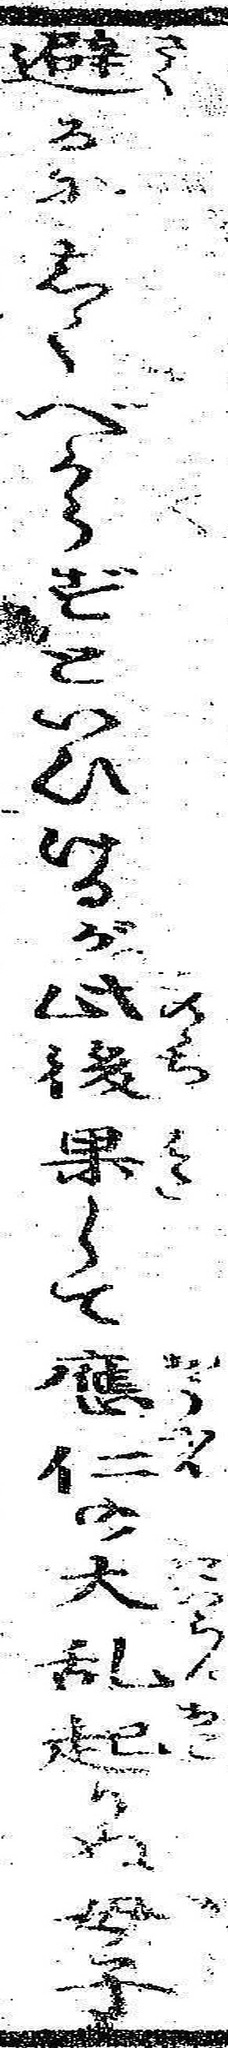避るにしくべからずといひけるが。此後果して応仁の大乱起りぬ母子
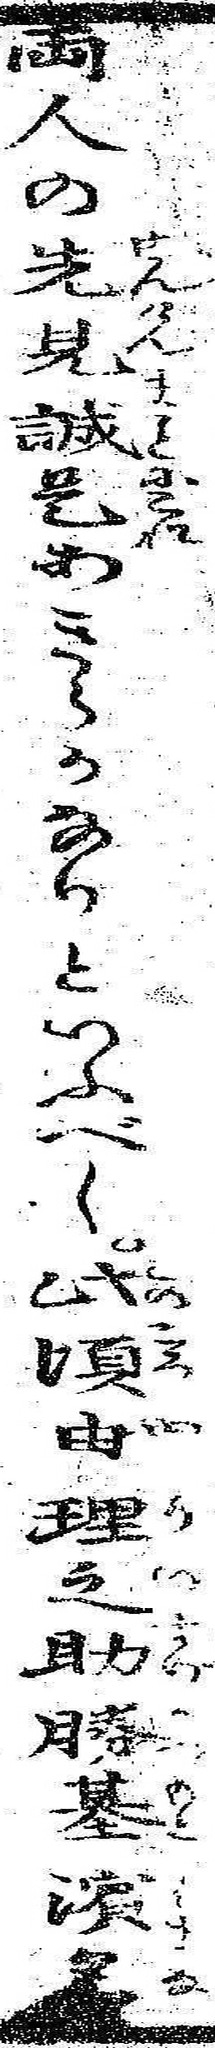両人の先見誠是あきらかなりといふべし。此頃由理之助勝基浜名
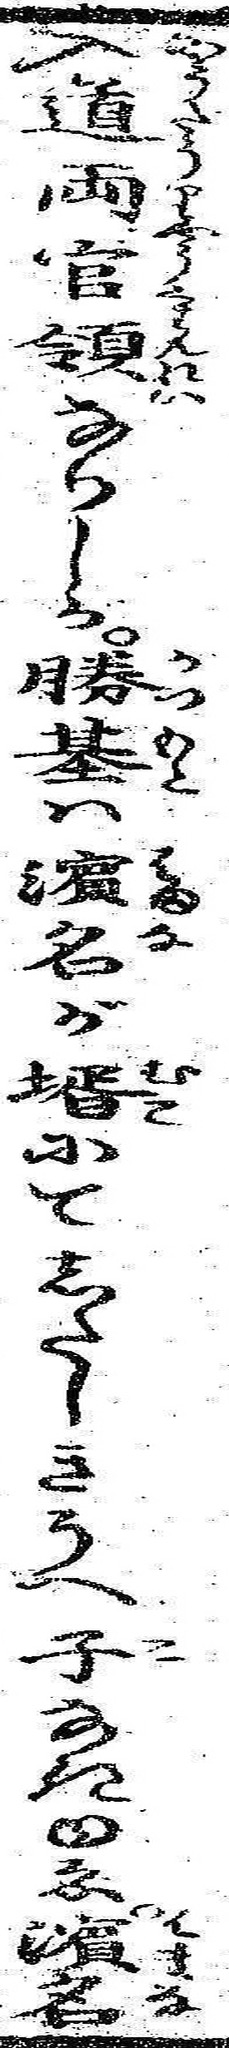入道両官領なりしが。勝基は浜名が婿にてしたしきうへ子なきゆゑ。浜名
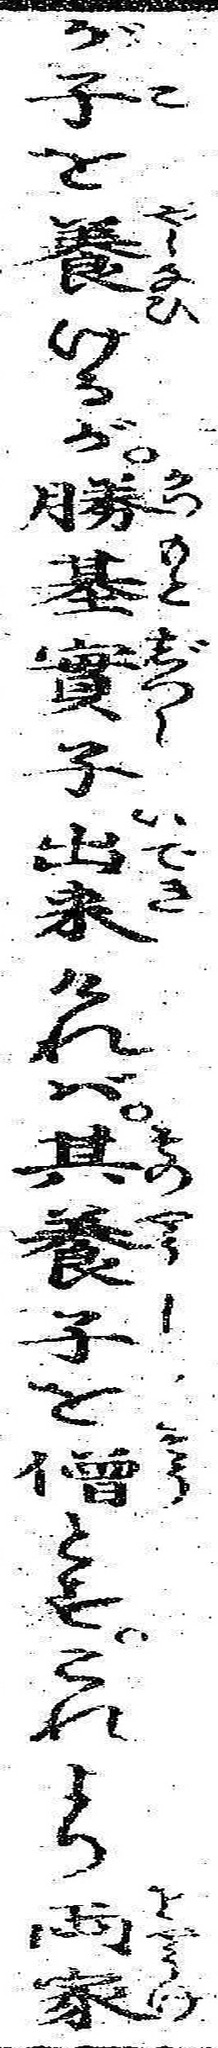が子を養けるが。勝基実子出来ければ。其養子を僧とす。これより両家
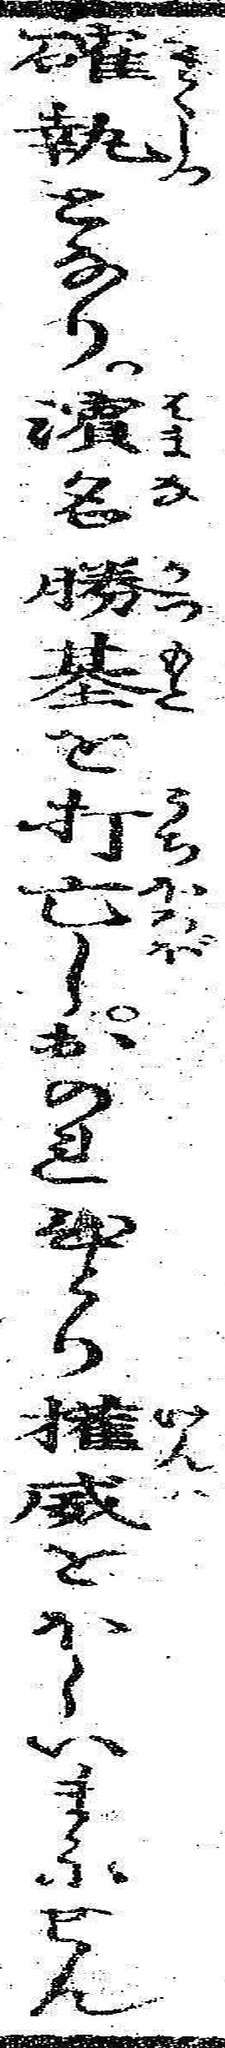碓執となり。浜名勝基を打亡し。おのれひとり権威をほしいまゝにせん
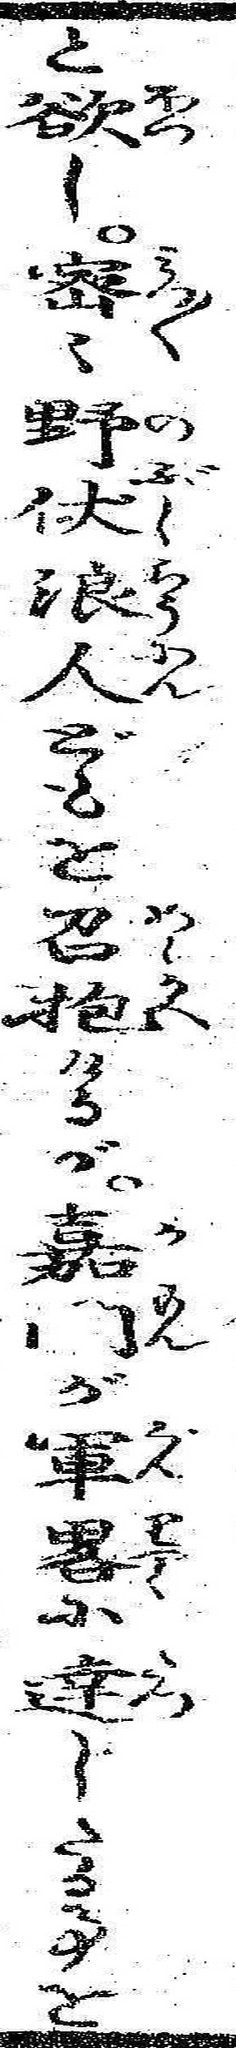と欲し。密々野伏浪人どもを召抱けるが。嘉門が軍略に達したる事を
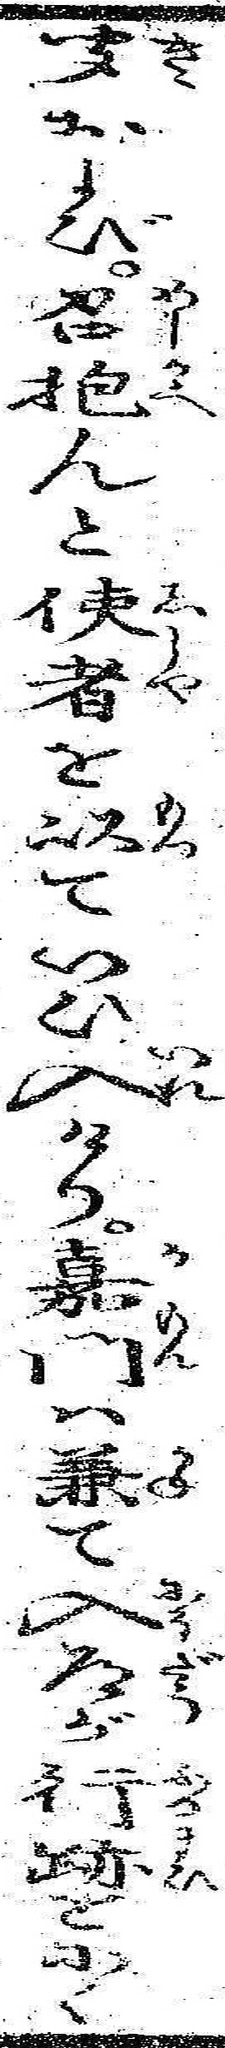聞および。召抱んと使者を以ていひ入けり。嘉門は兼て入道が行跡をにく
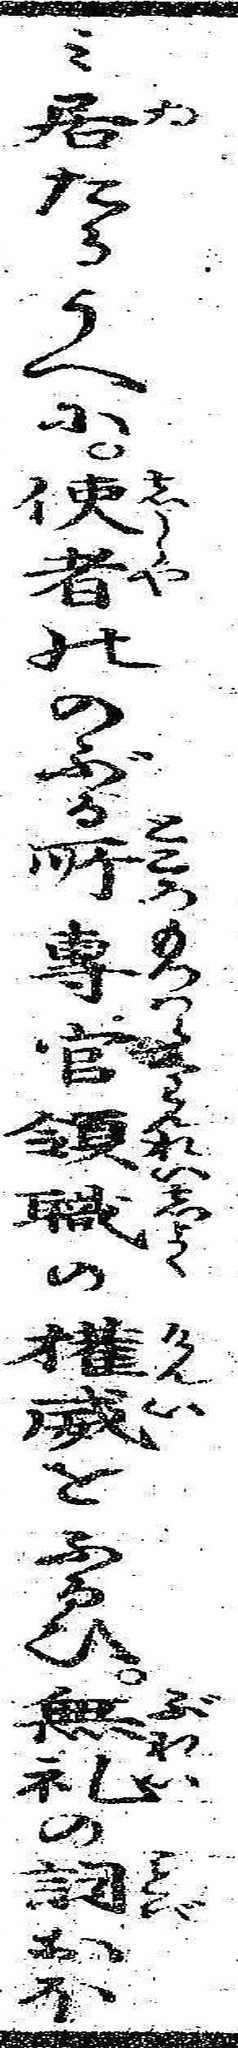み居たるうへに。使者ののぶる所専官領職の権威をふるひ。無礼の詞おほ
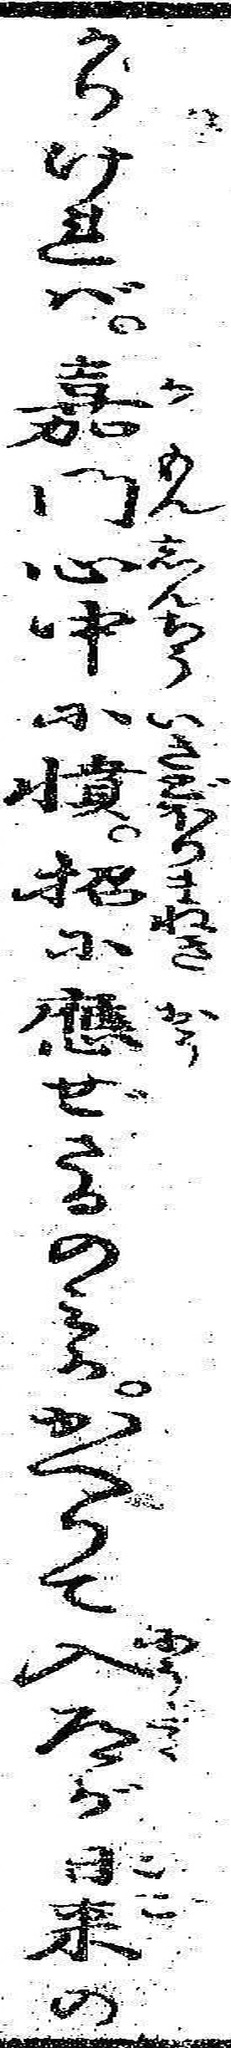かりければ。嘉門心中に憤。招に応ぜさるのみか。かへりて入道が日来の
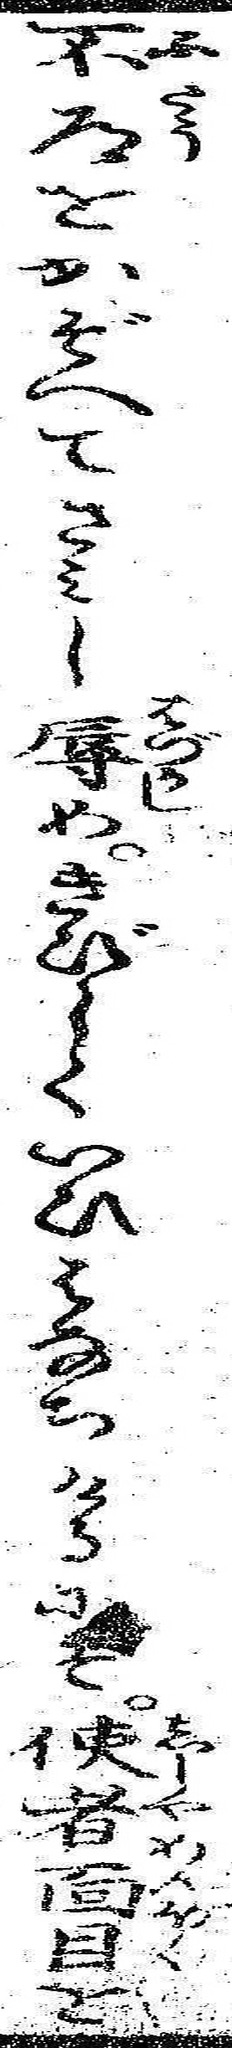不道をかぞへてさみし辱め。きびしくいひはなちけるにそ。使者面目を
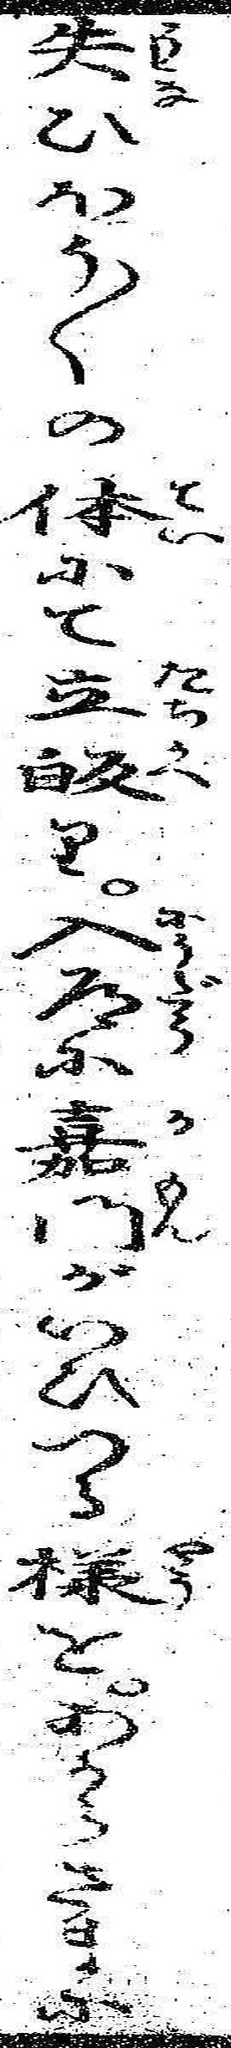失ひほう〳〵の体にて立帰り。入道に嘉門がいひつる様を。あからさまに
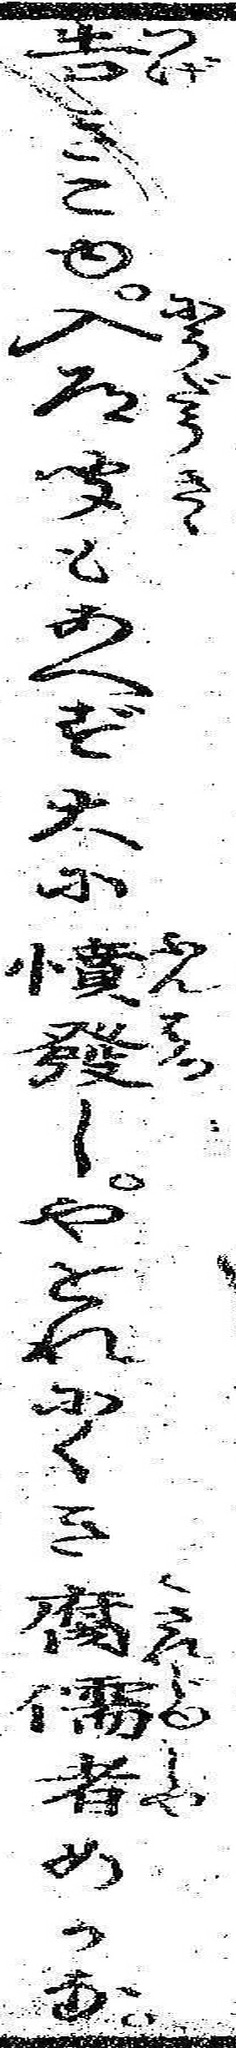告きこゆ。入道聞もあへず大に憤発し。やをれにくき腐儒者めかな。
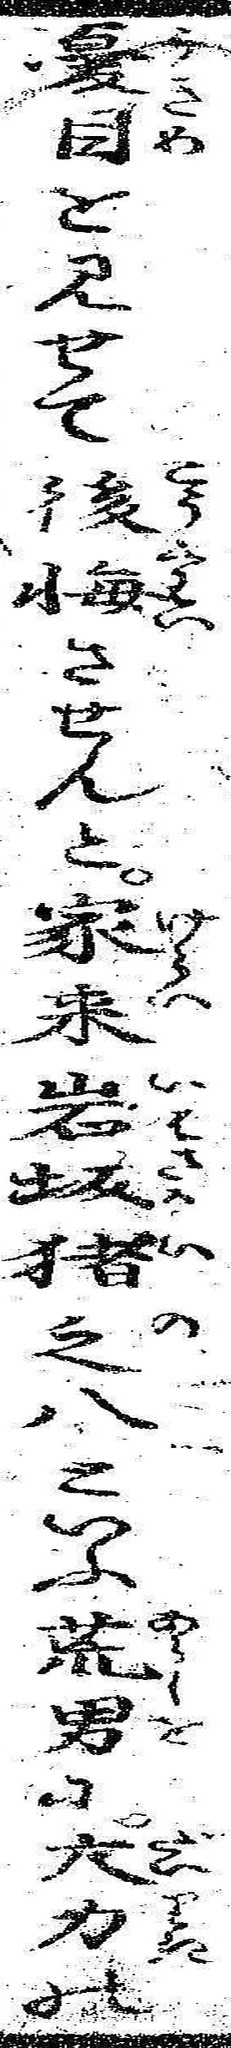憂目を見せて後悔させんと。家来岩坂猪之八といふ荒男に。大力の

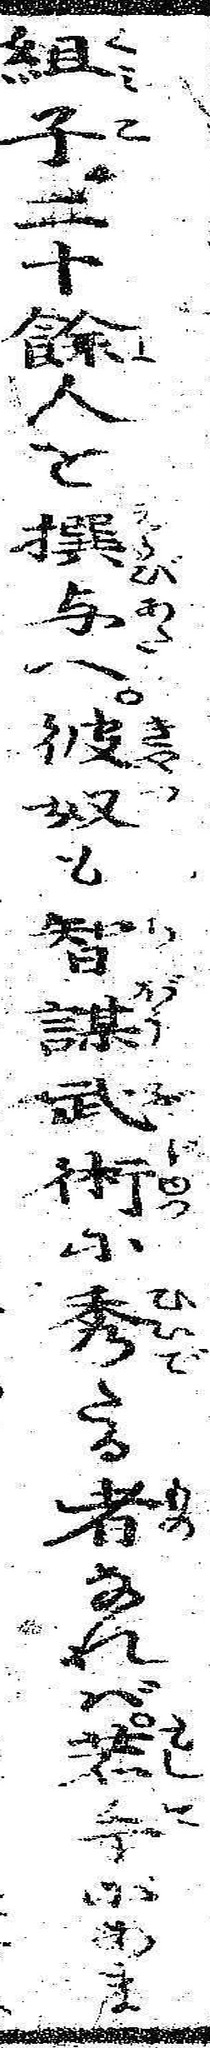組子二十余人を撰与へ。彼奴も智謀武術に秀たる者なれば。若手にあま
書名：昔話稲妻表紙
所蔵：国文学研究資料館
